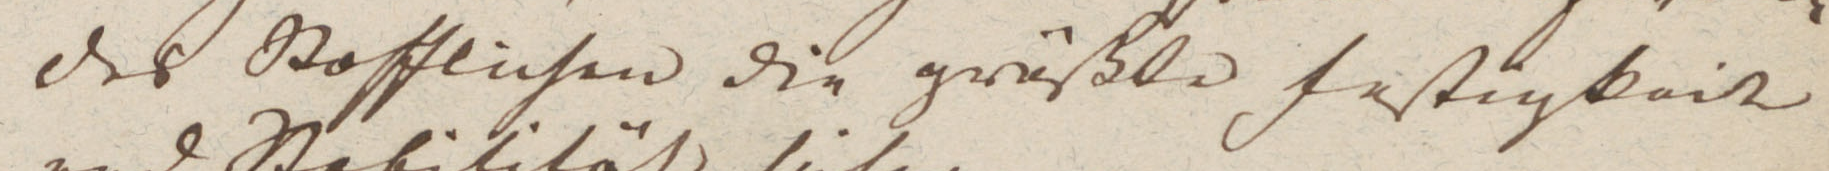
des Stofflichen die grösste Festigkeit
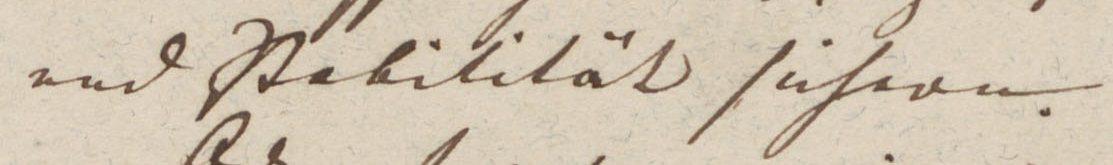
und Stabilität sichern.
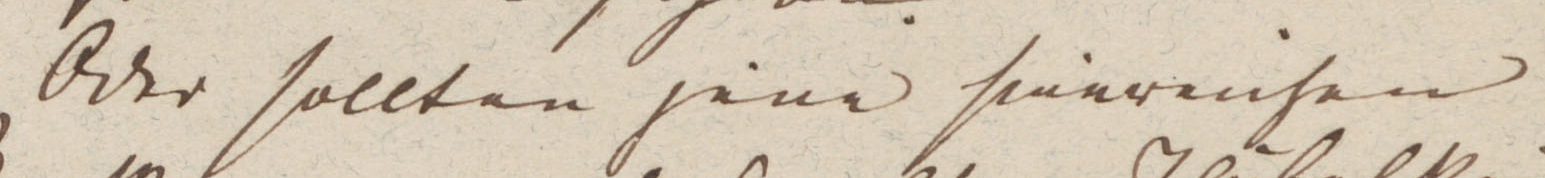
Oder sollten jene sinnreichen
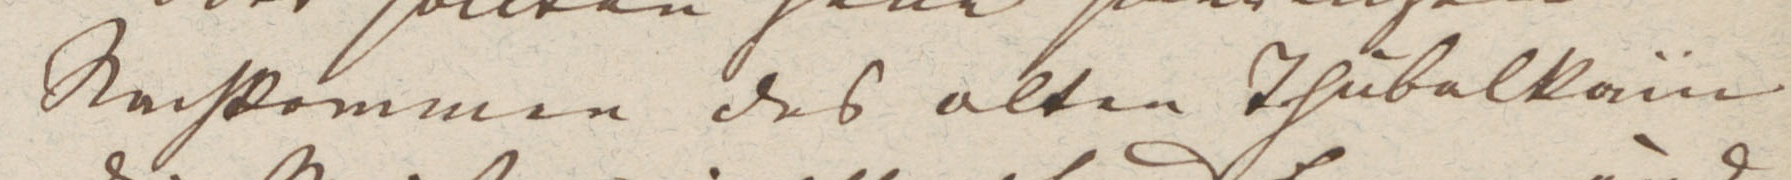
Nachkommen des alten Thubalkain
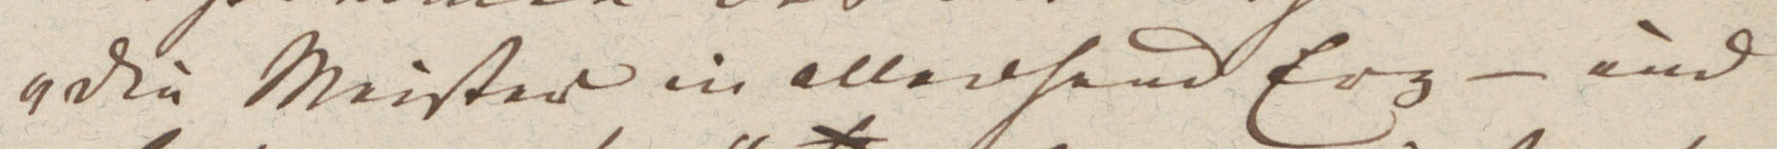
"die Meister in allerhand Erz- und
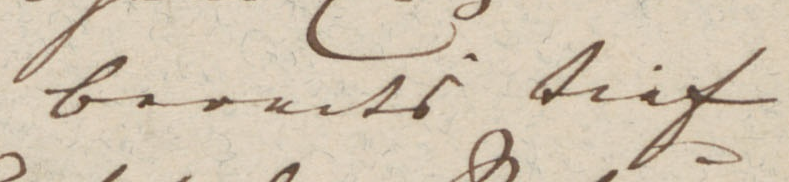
bereits tief
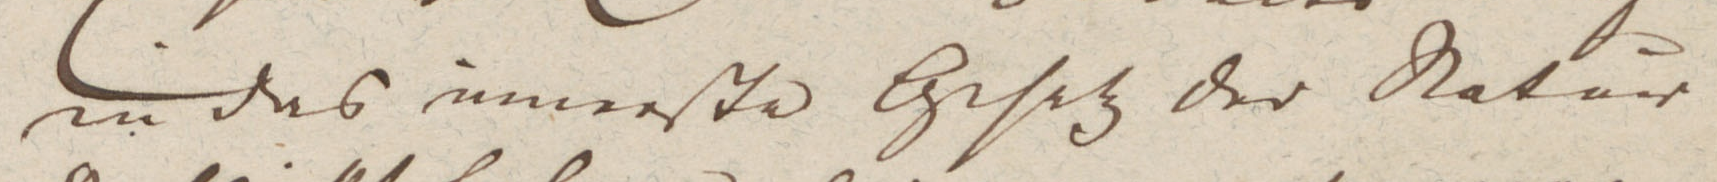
in das innerste Gesetz der Natur
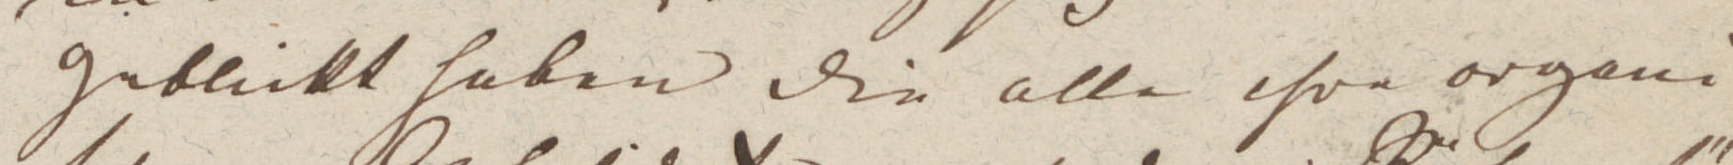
geblickt haben die alle ihre organi-
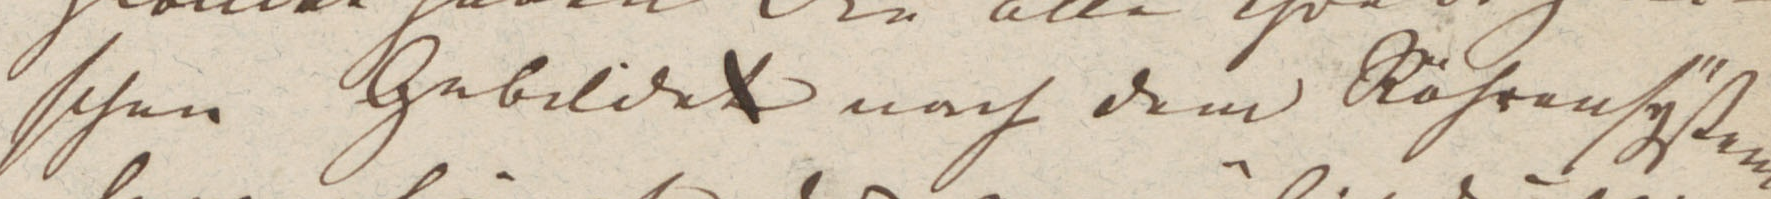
schen Gebildet nach dem Röhrensysteme
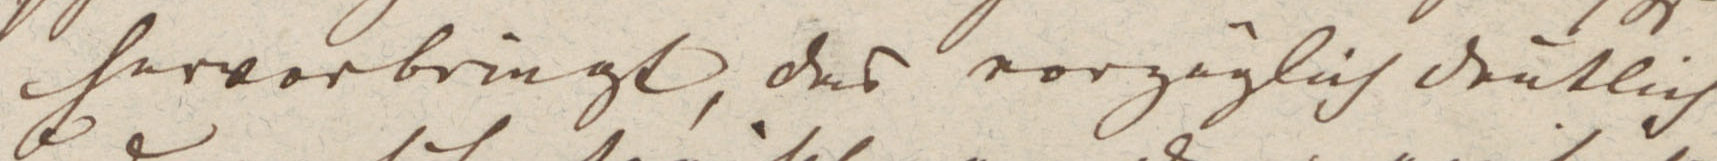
hervorbringt, das vorzüglich deutlich
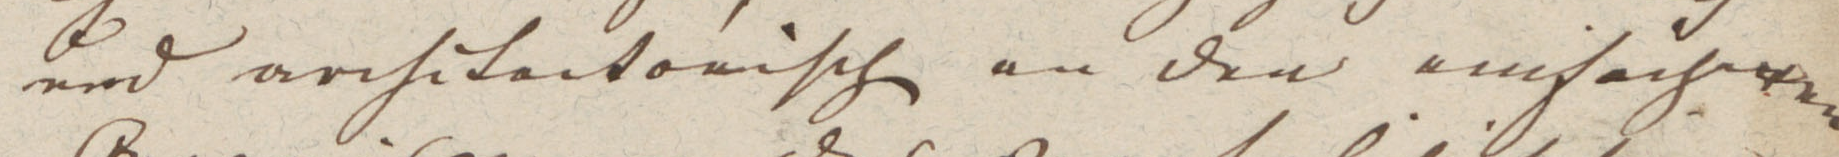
und architectonisch an den einfachenren
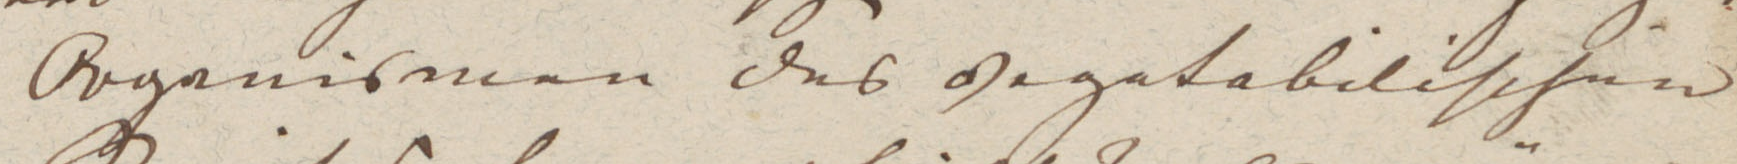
Organismen des vegetabilischen
